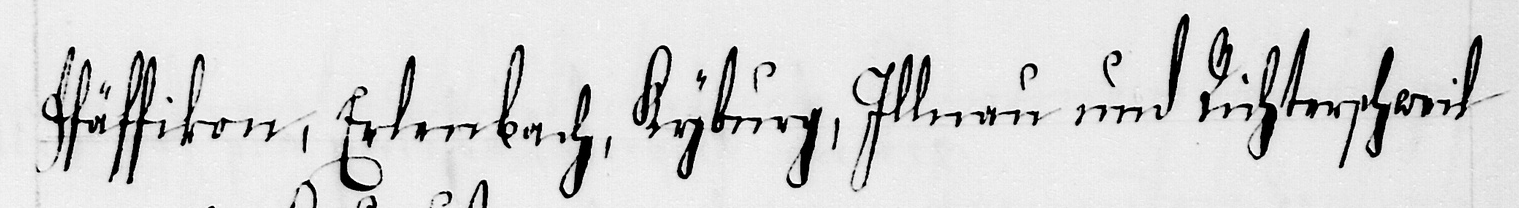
Pfäffikon, Erlenbach, Kyburg, Illnau und Richterschweil
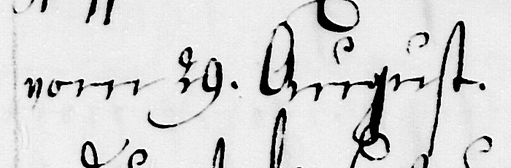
vom 29. August.
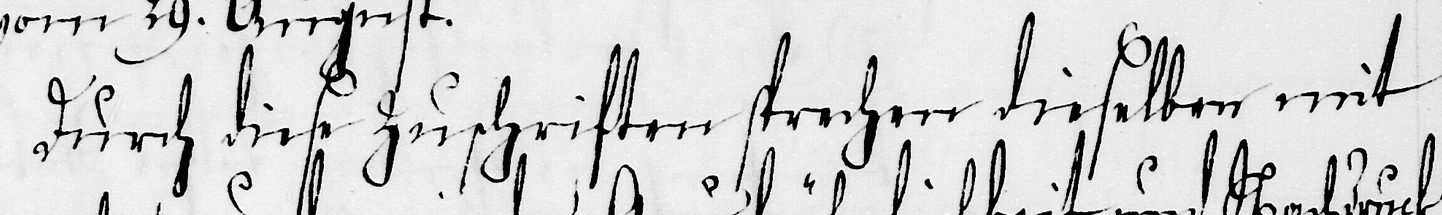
Durch diese Zuschriften sprechen dieselben mit
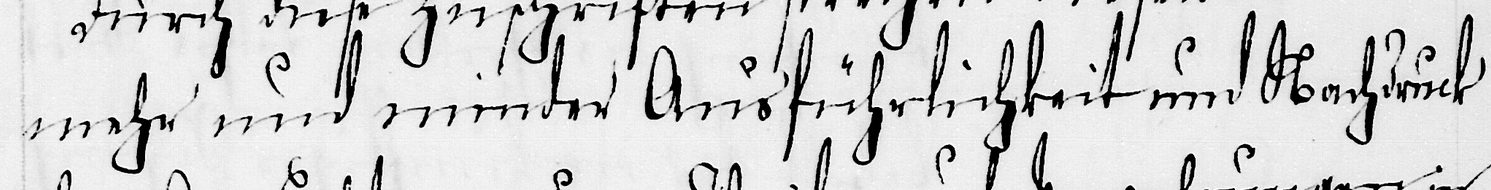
mehr und minder Ausführlichkeit und Nachdruck
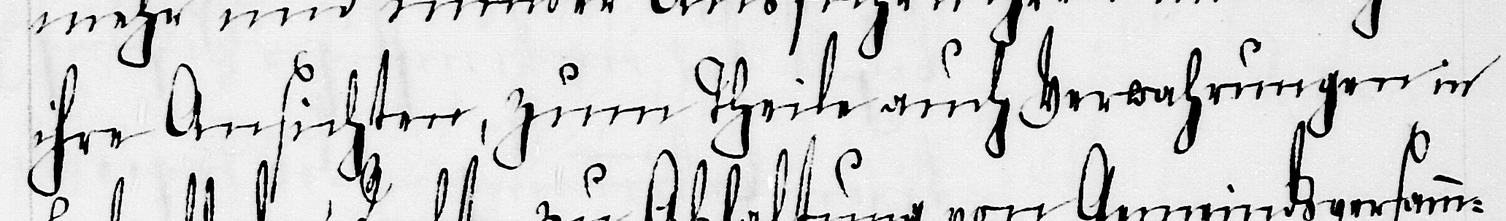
ihre Ansichten, zum Theile auch Verwahrungen in
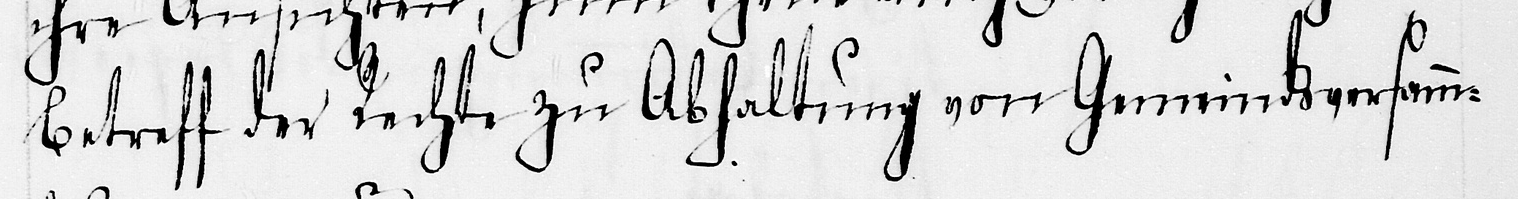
Betreff der Rechte zu Abhaltung von Gemeindsversamm¬
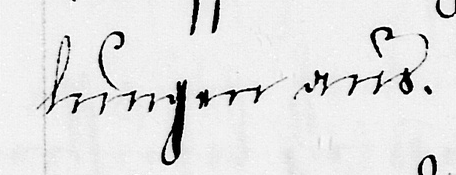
lungen aus.
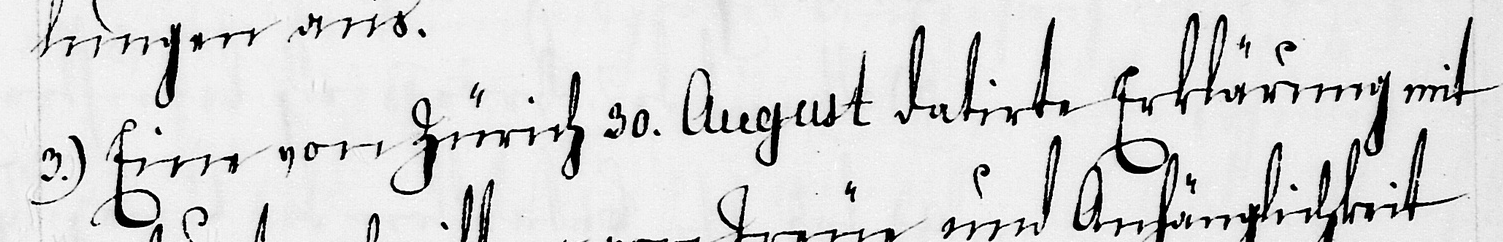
3.) Eine von Zürich 30. August datirte Erklärung mit
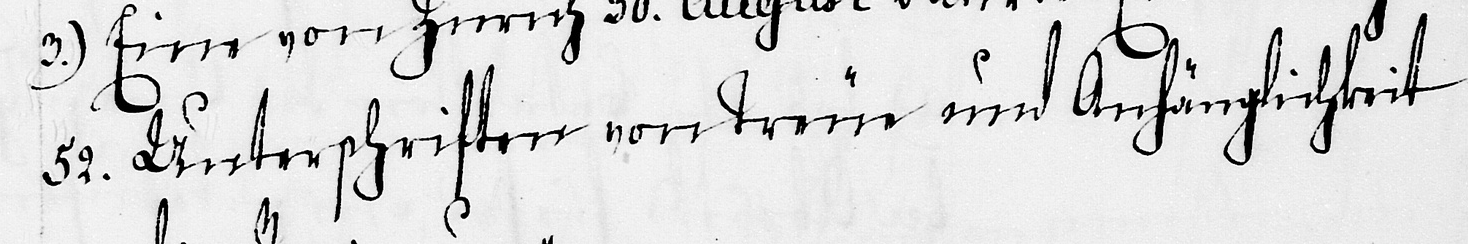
52. Unterschriften von Treue und Anhänglichkeit
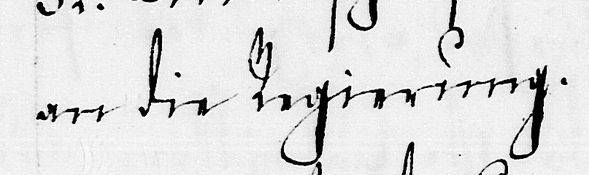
an die Regierung.
